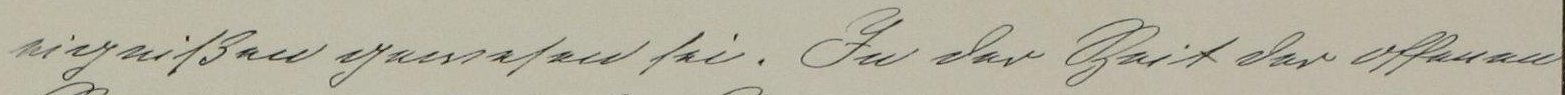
eignissen gewesen sei. In der Zeit der offenen
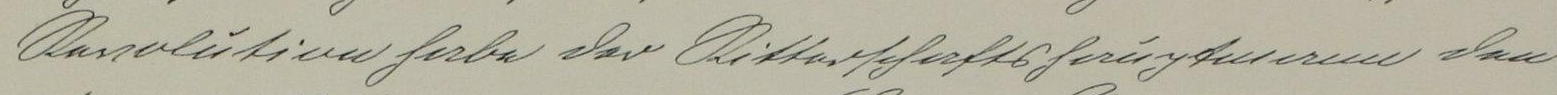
Revolution habe der Ritterschaftshauptmann den
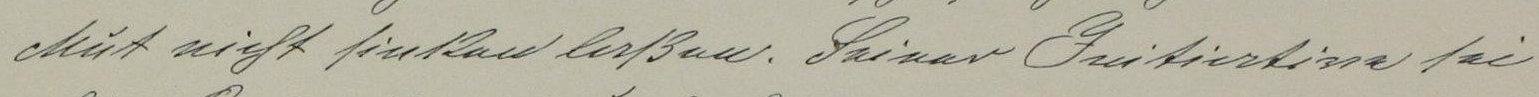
Mut nicht sinken laßen. Seiner Initiative sei
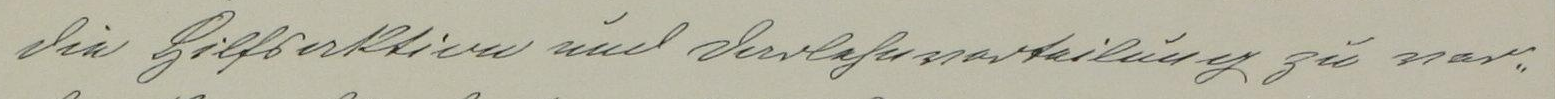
die Hilfsaktion und Darlehnverteilung zu ver-
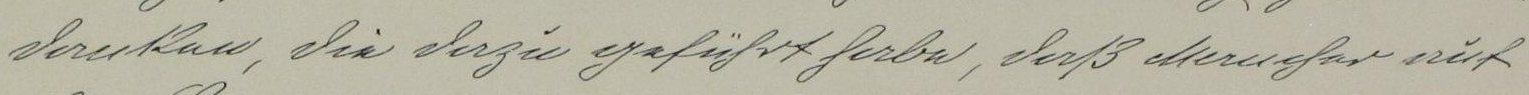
danken, die dazu geführt habe, daß Mancher auf
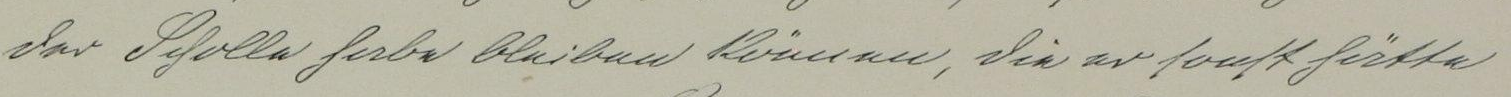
der Scholle habe bleiben können, die er sonst hätte
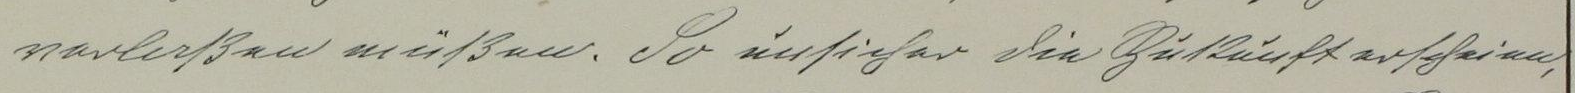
verlaßen müßen. So unsicher die Zukunft erscheine,
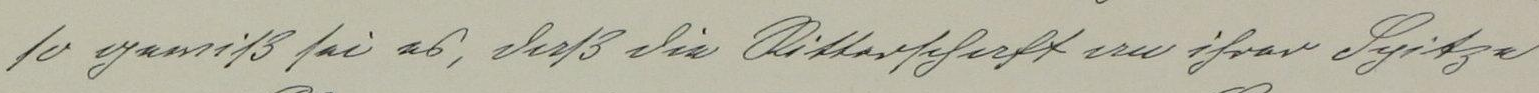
so gewiß sei es, daß die Ritterschaft an ihrer Spitze
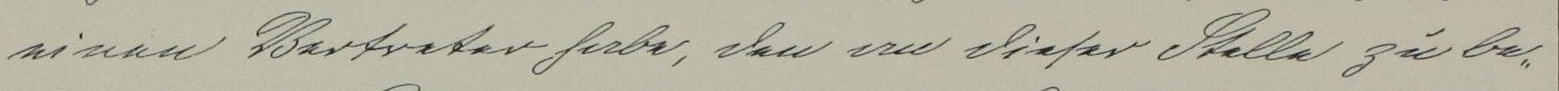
einen Vertreter habe, den an dieser Stelle zu be-
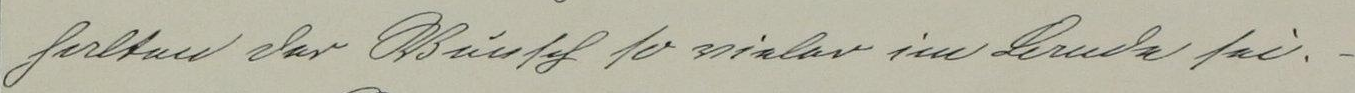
halten, der Wunsch so vieler im Lande sei.
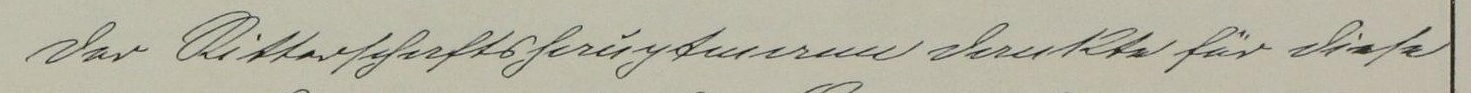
Der Ritterschaftshauptmann dankte für diese
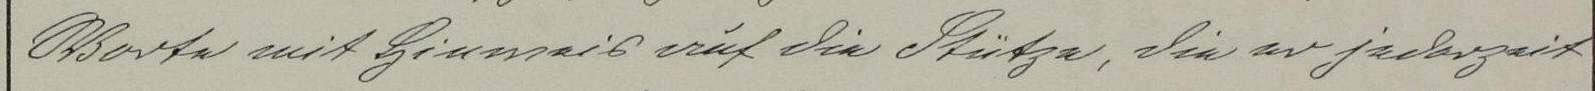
Worte mit Hinweis auf die Stütze, die er jederzeit
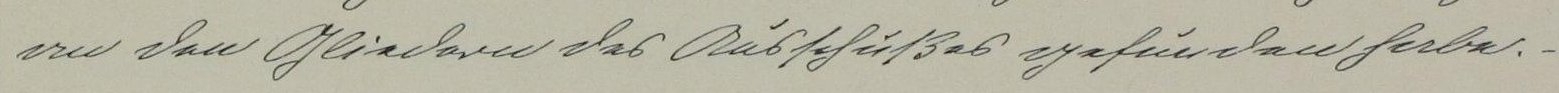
an den Gliedern des Ausschußes gefunden habe.
